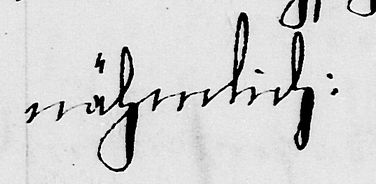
nähmlich:
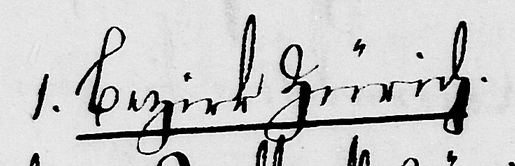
1. Bezirk Zürich.
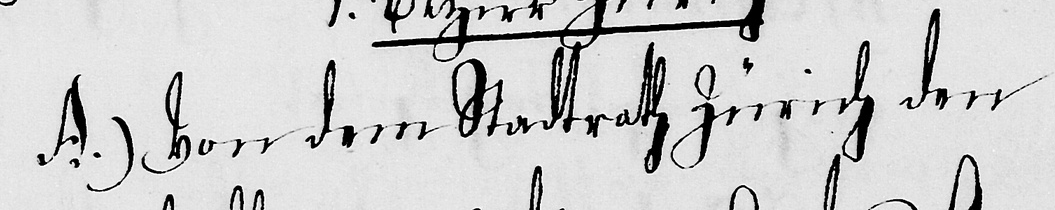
A.) Von dem Stadtrath Zürich den
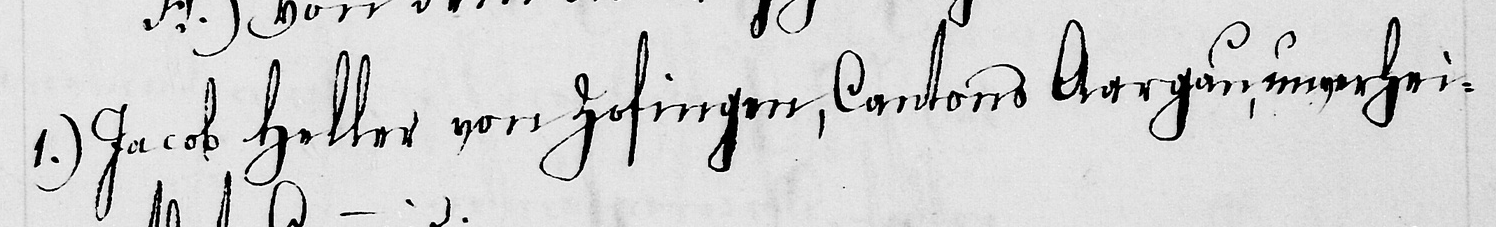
1.) Jacob Heller von Zofingen, Cantons Aargau, unverhei¬
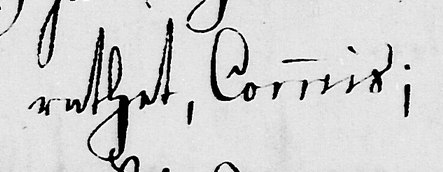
rathet, Commis;
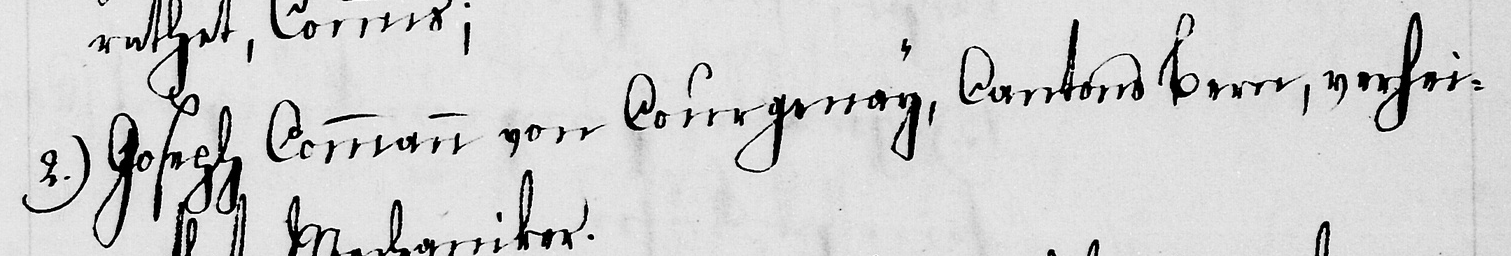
2.) Joseph Commann von Courgenay, Cantons Bern, verhei¬
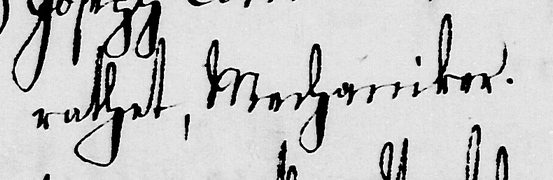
rathet, Mechaniker.
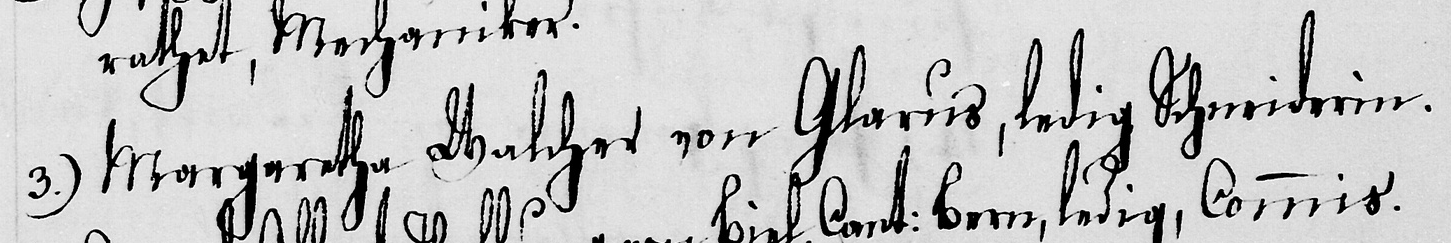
3.) Margaretha Walcher von Glarus, ledig Schneiderin.
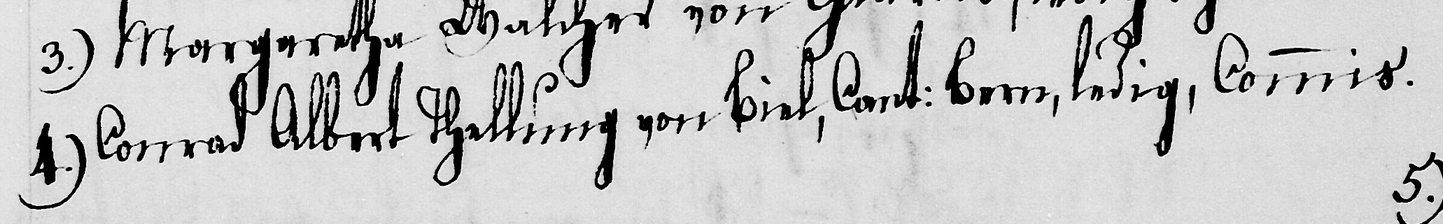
4.) Conrad Albert Thellung von Biel, Cant: Bern, ledig,
